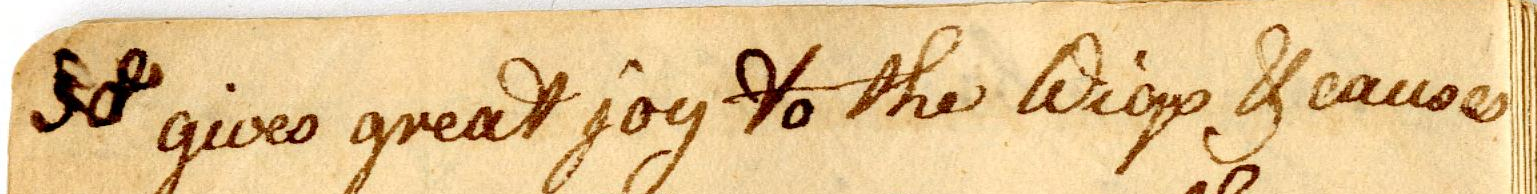^38 gives great joy to the Wigs & causes
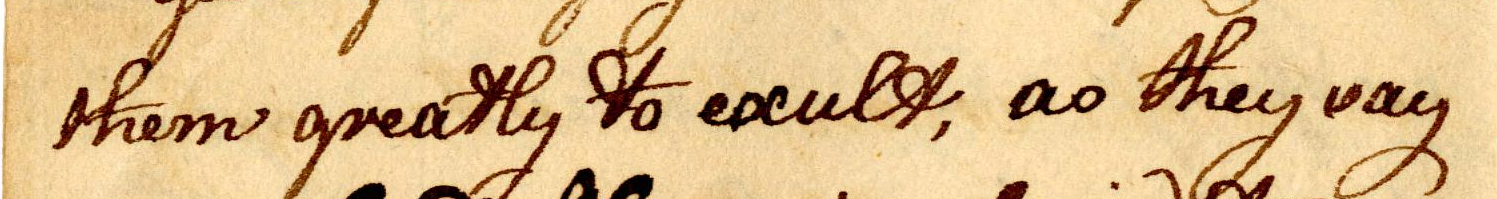them greatly to exult, as they say
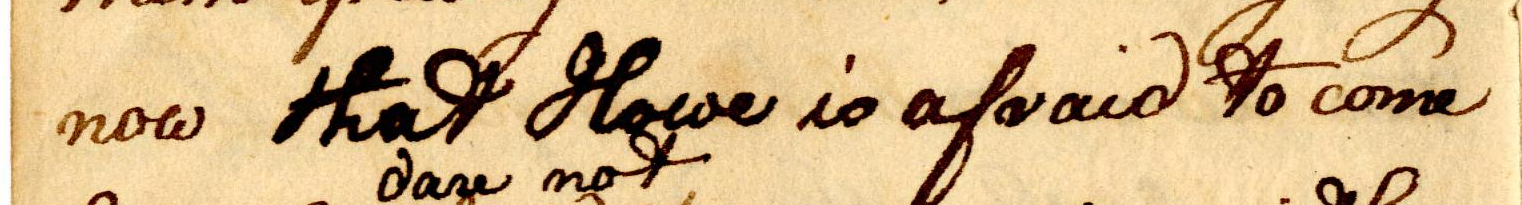now that Howe is afraid to come
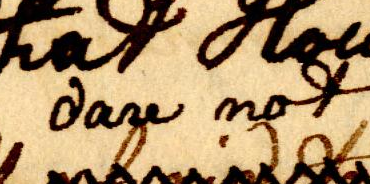dare not
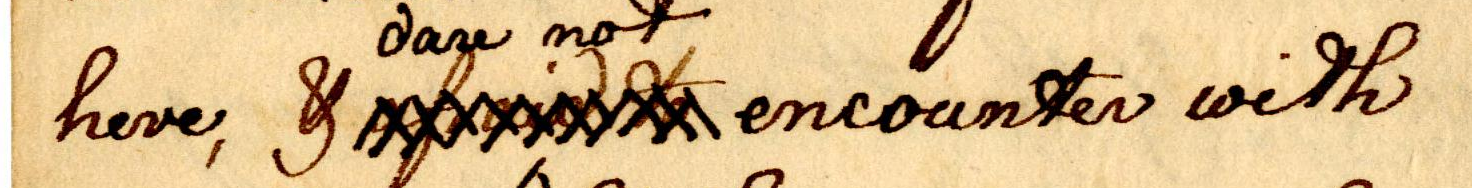here, & ^ [afraid to] encounter with
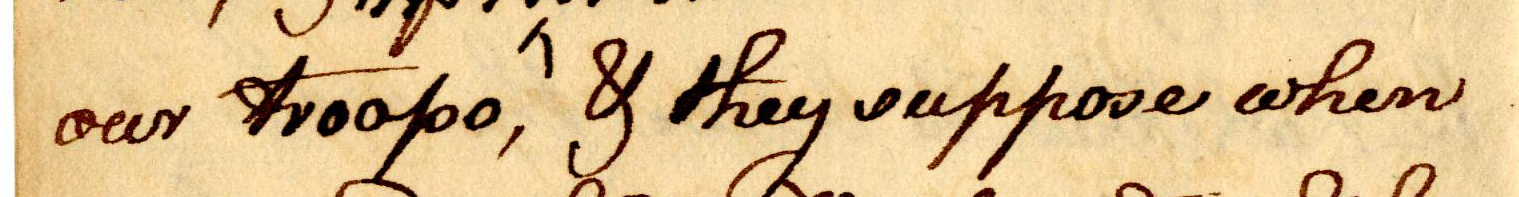our troops, & they suppose when
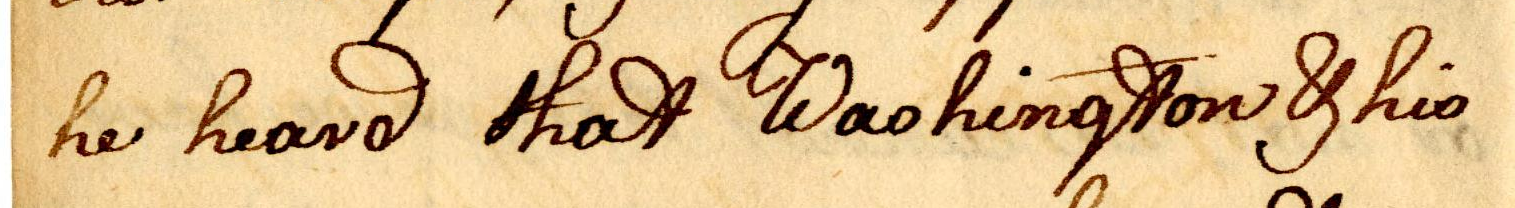he heard that Washington & his
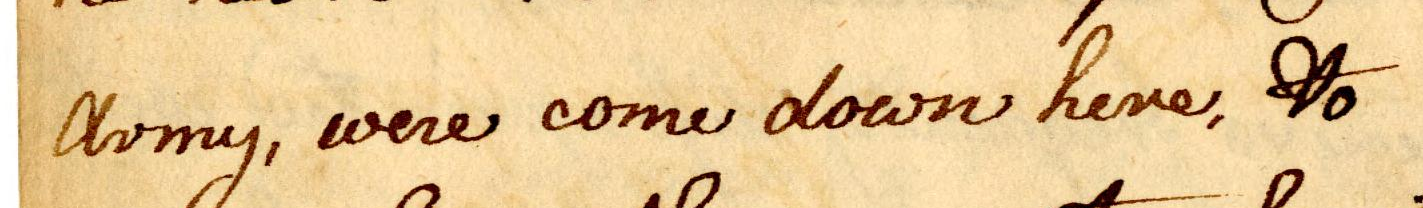Army, were come down here, to
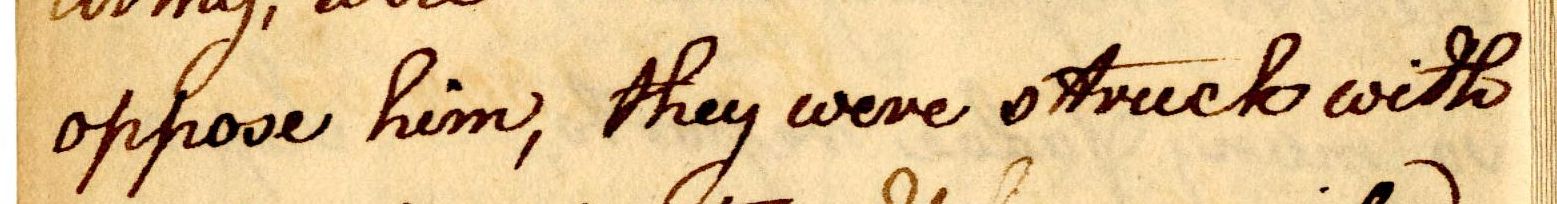oppose him, they were struck with
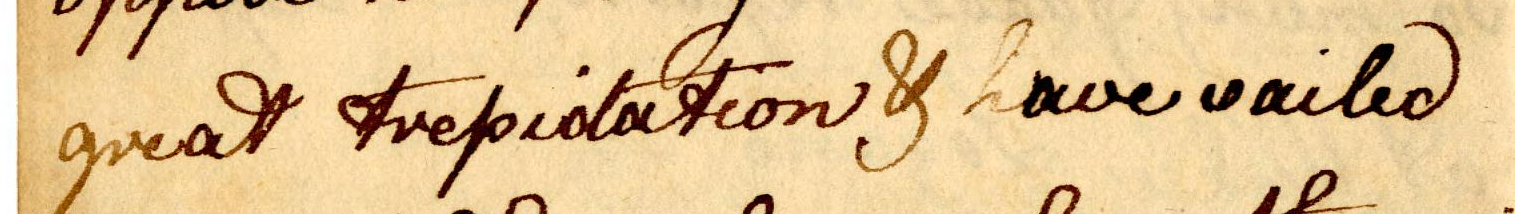great trepidation & have sailed
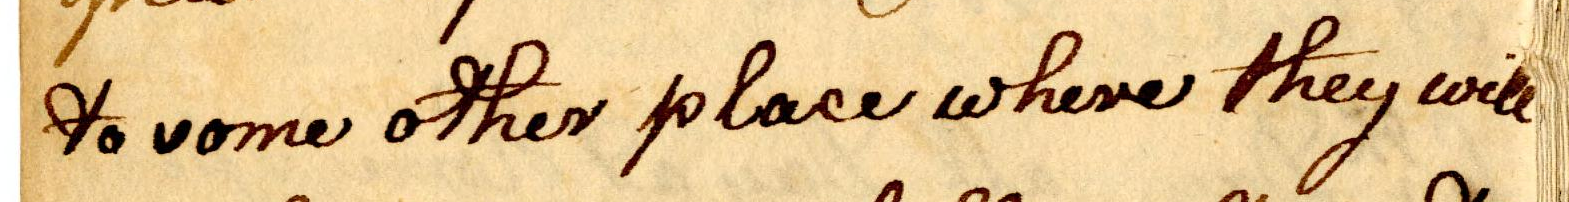to some other place where they will
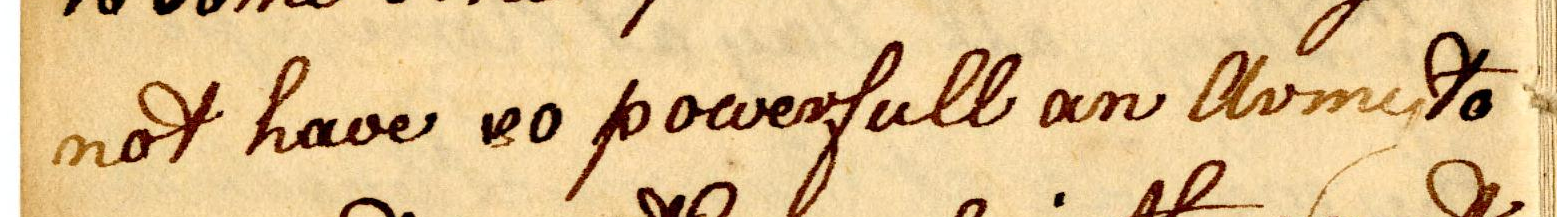not have so powerfull an Army to
